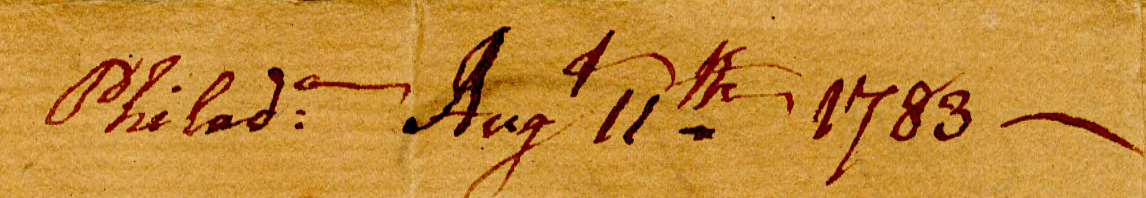Philad^a: Aug^t 11^th. 1783-
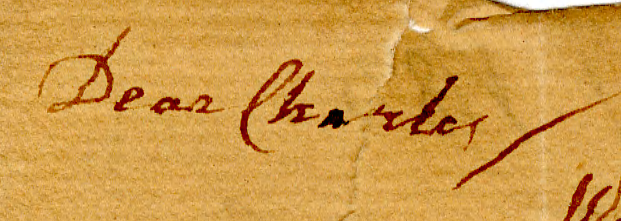Dear Charles
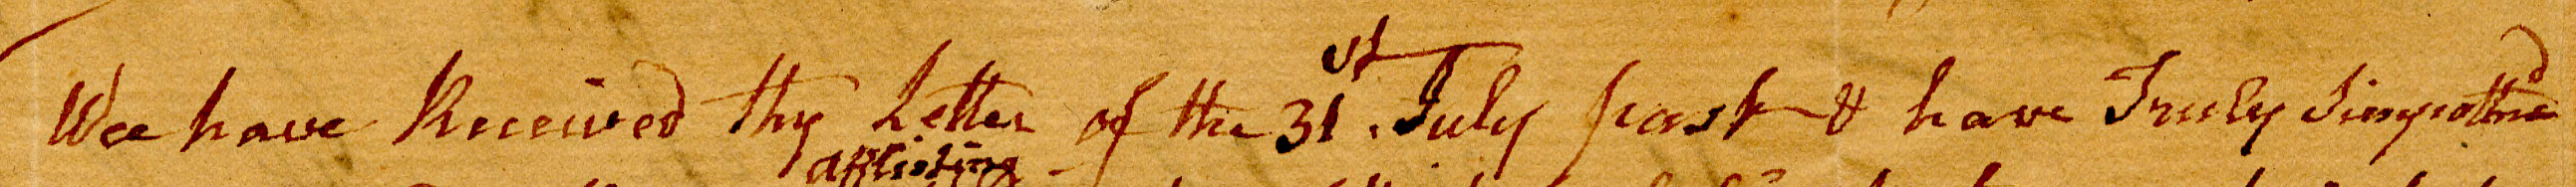Wee have Received thy Letter of the 31^st. of July past & have Truly simpathie^d
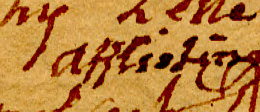afflicting
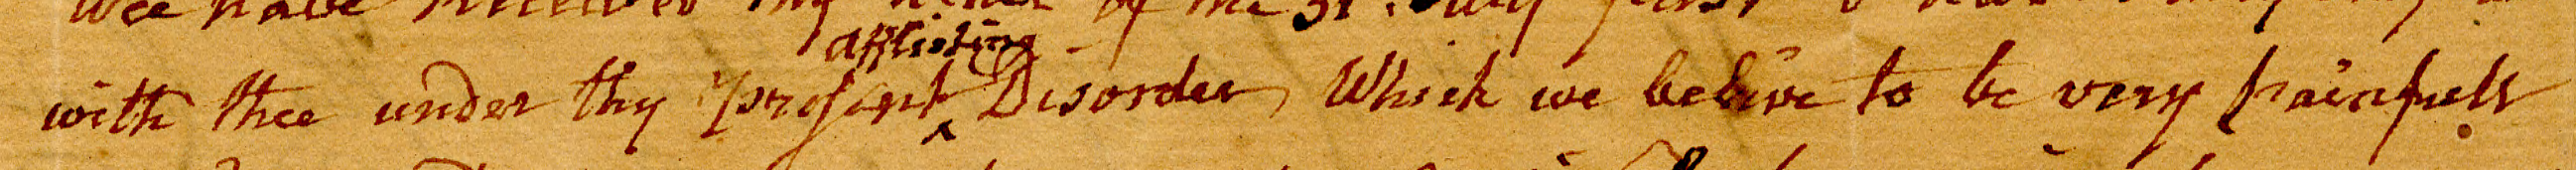with thee under they present ^ Disorder Which we believe to be very painfull
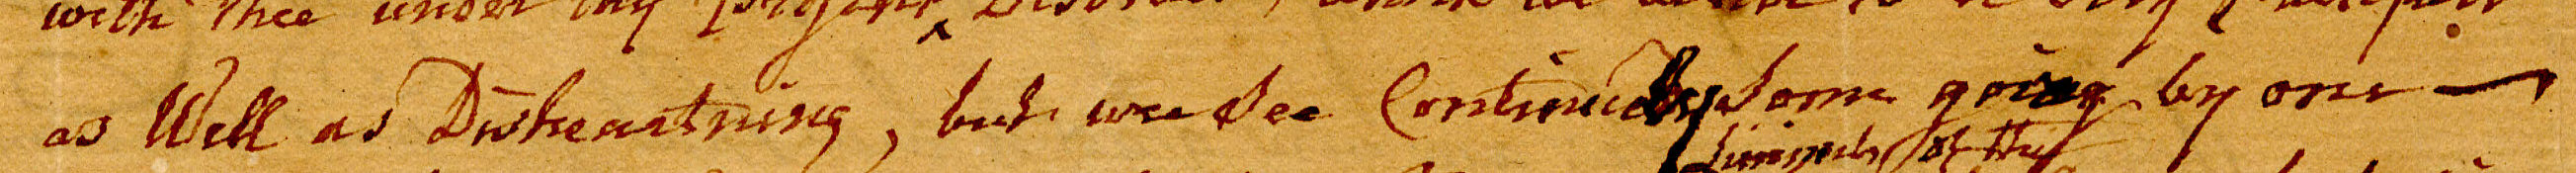as well as Disheartning, but we See continuely some going by one-
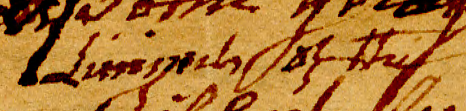Livingness of the
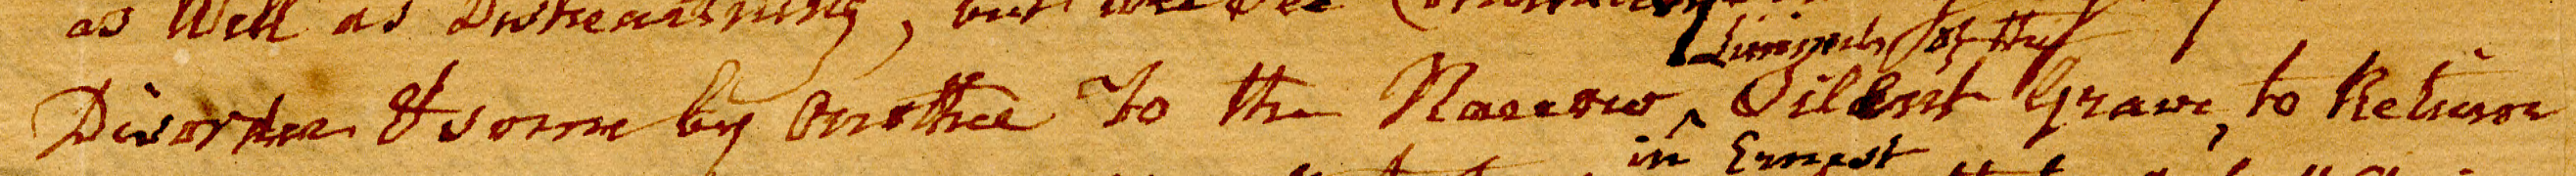Disorder & some by another To the Narrow ^ illest Grawe, to Retiusors
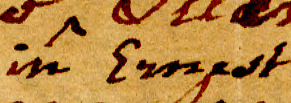in Ernest
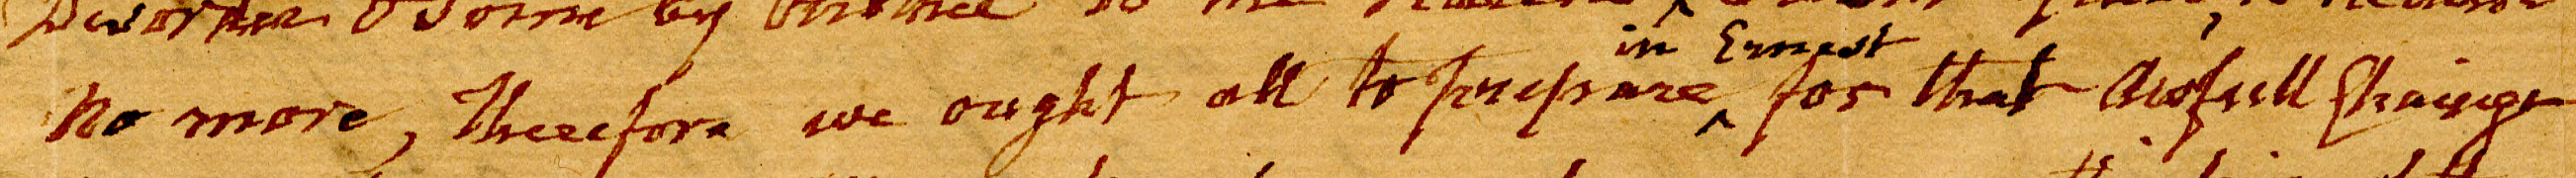no more, Therefore we ought all to prepare ^ for that Awfull Elrange
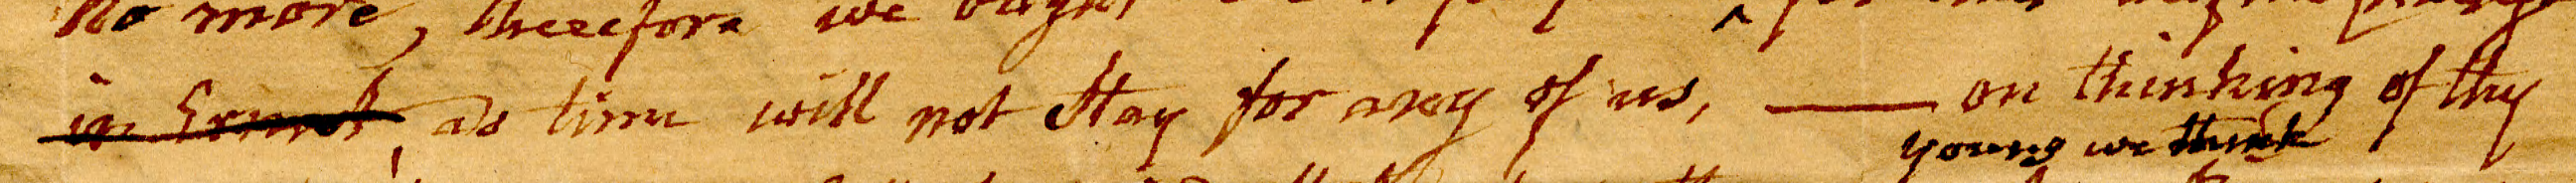[in Ernest] as time will not Stay for away of us, - on thinking of thy
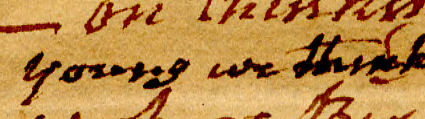young we think
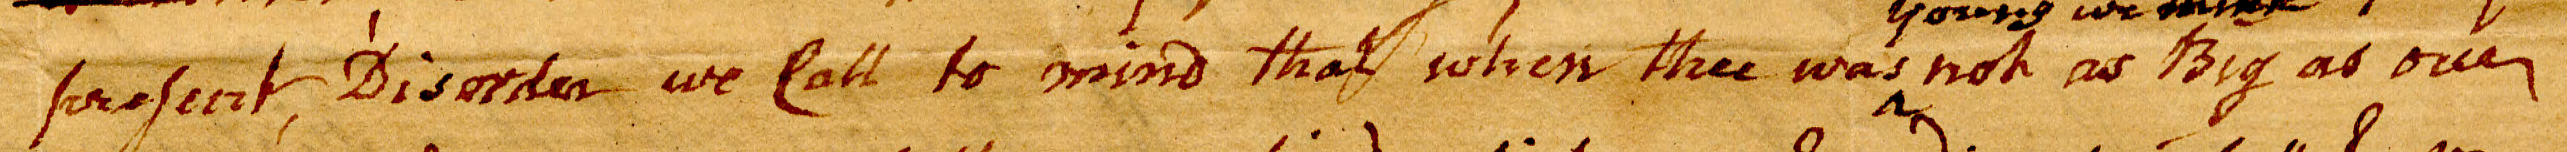present Disorder we Call to mind that when thee was ^ not as Big as our
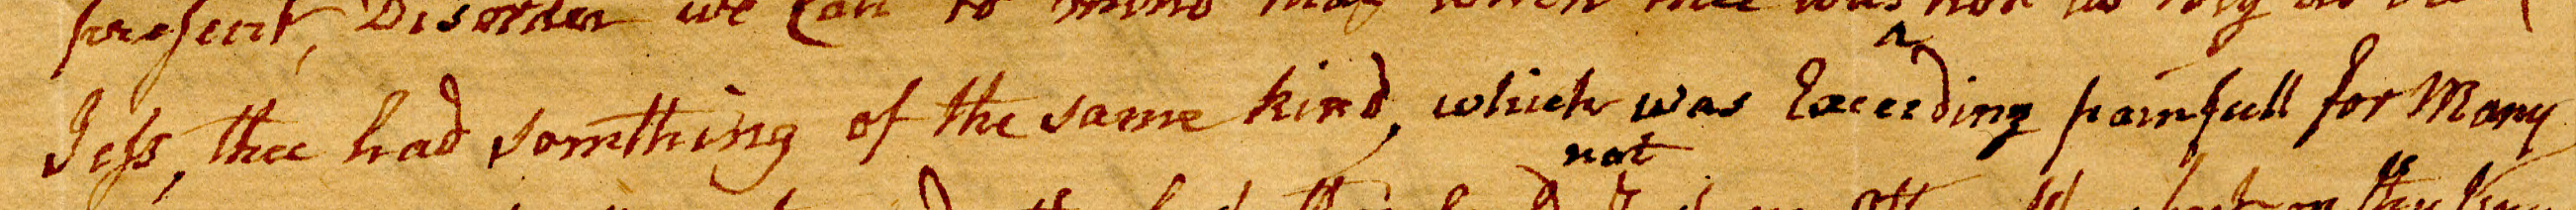Jess, thee had something of the same kind, which was Exceeding painfull for Many
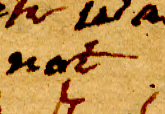not
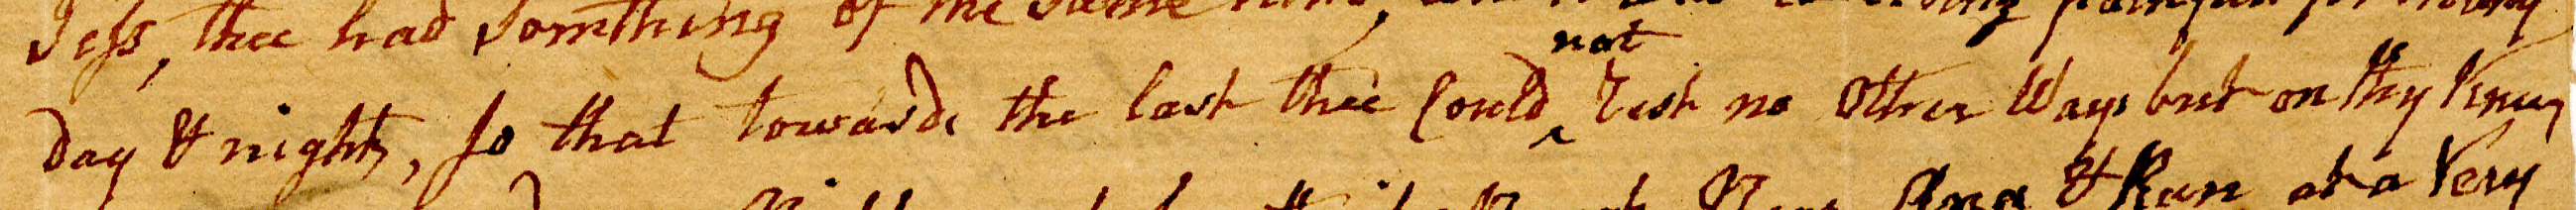day & nights, so that towards the last thee could ^ rest no other Ways but on thy knees
